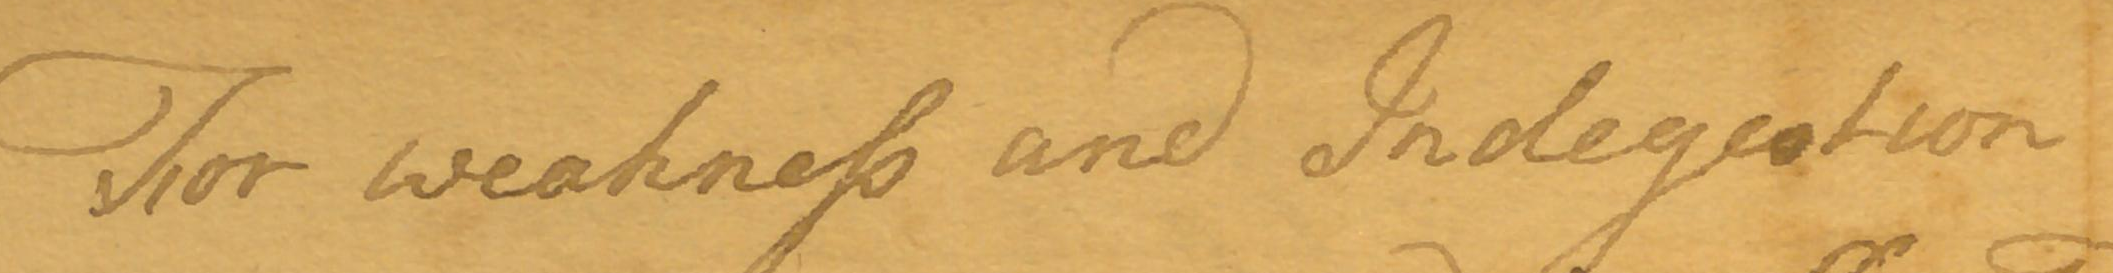For weakness and Indegestion
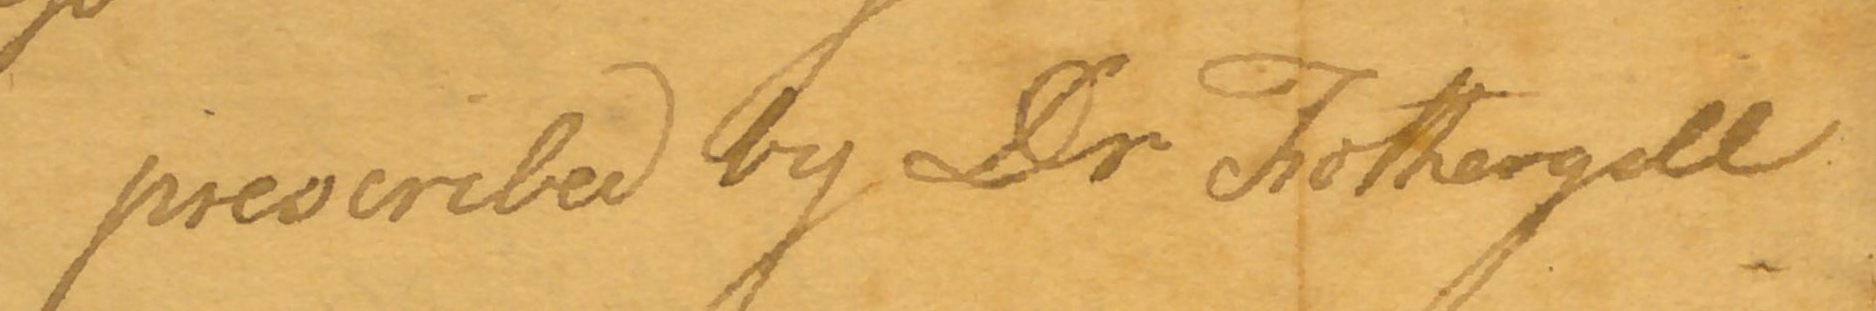prescribed by Dr Fothergill
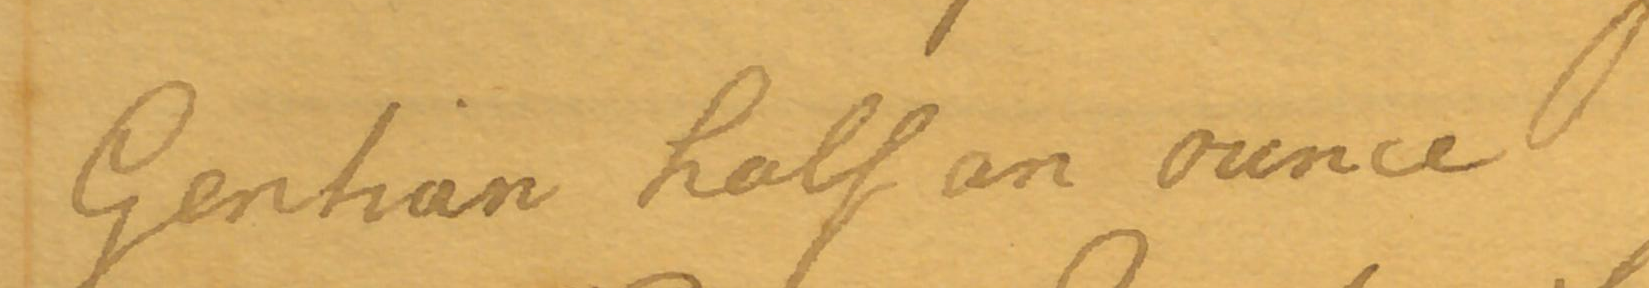Gentian half an ounce
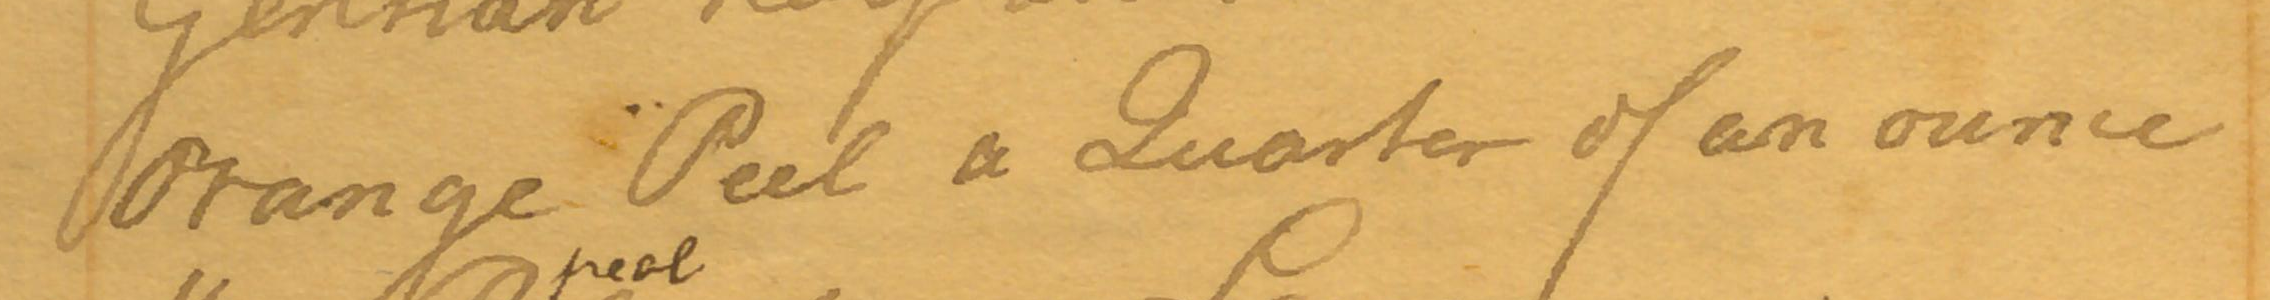orange Peel a Quarter of an ounce
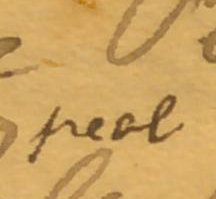peal
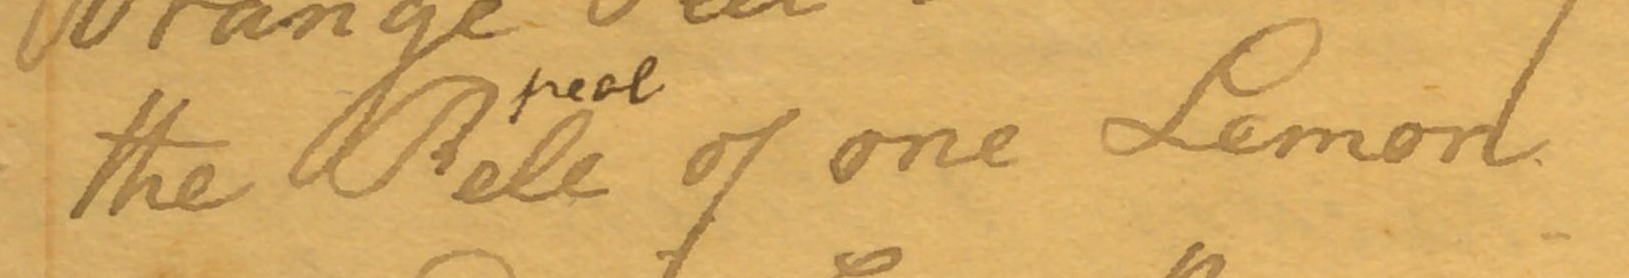the Pele of one Lemon
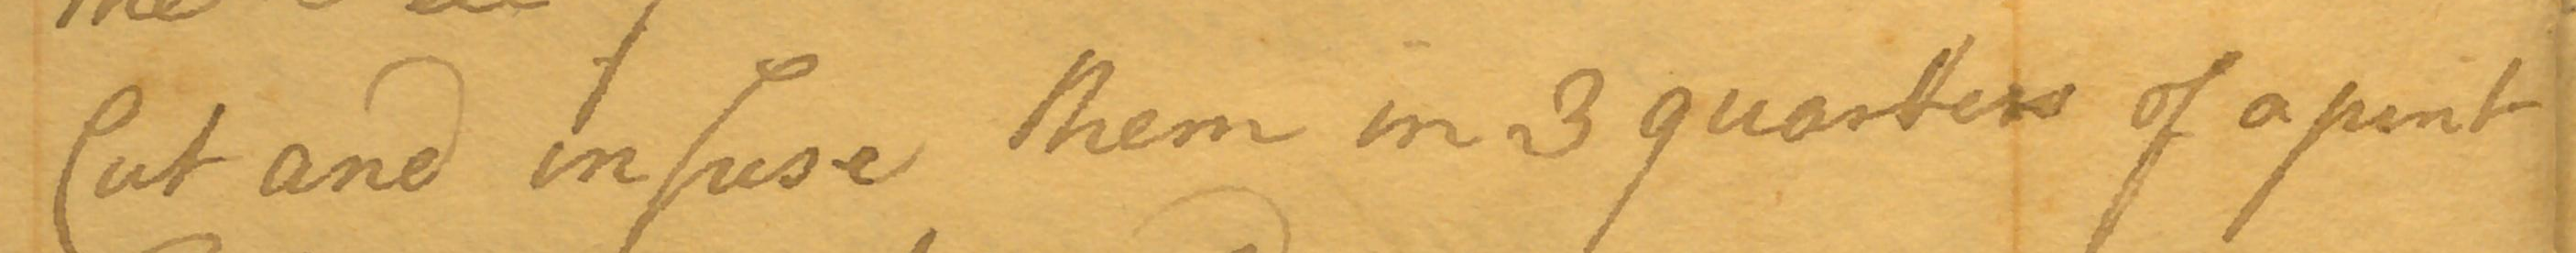Cut and infuse them in 3 quarters of a pint
